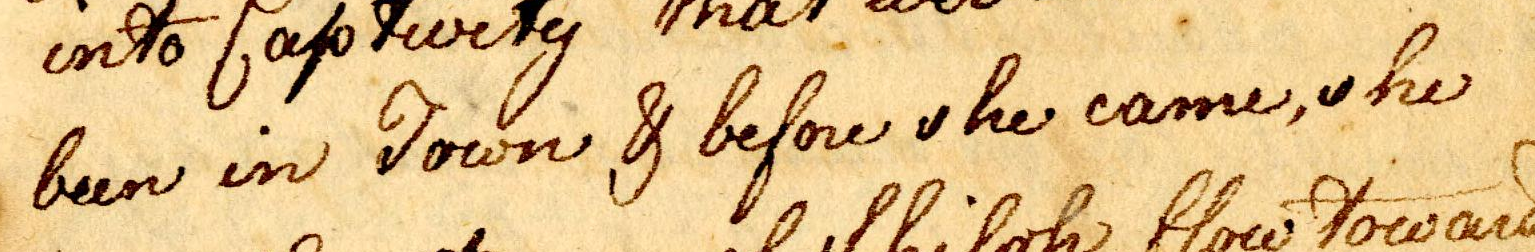been in Town & before she came, she
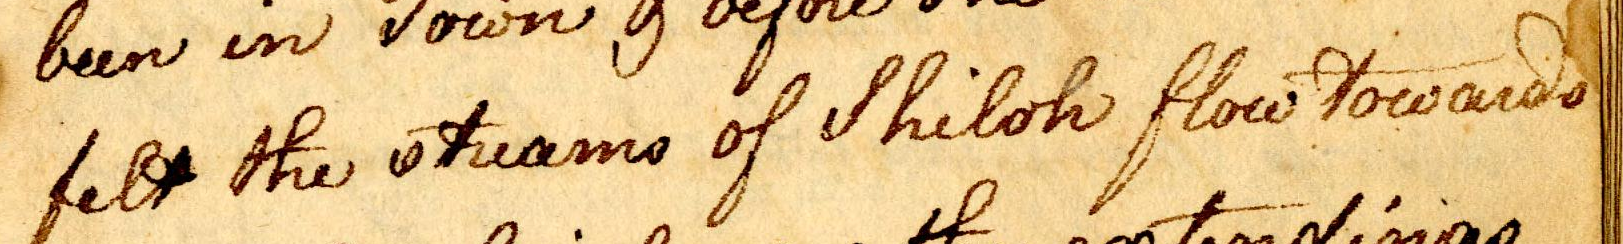felt the streams of Shiloh flow towards
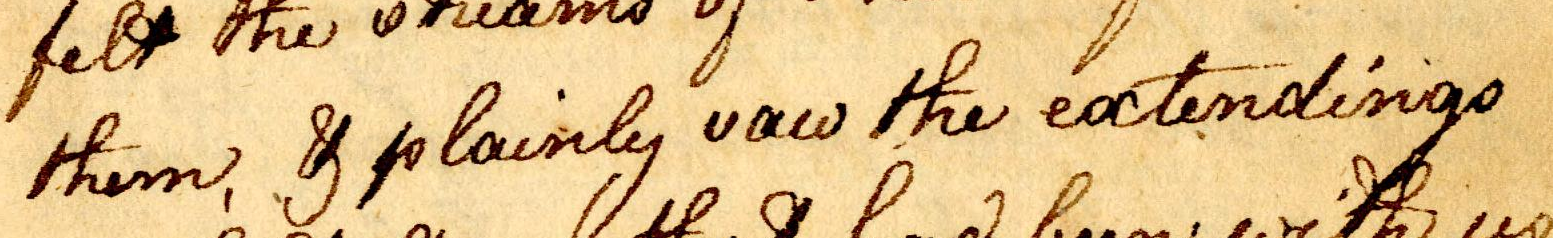them, & plainly saw the extendings
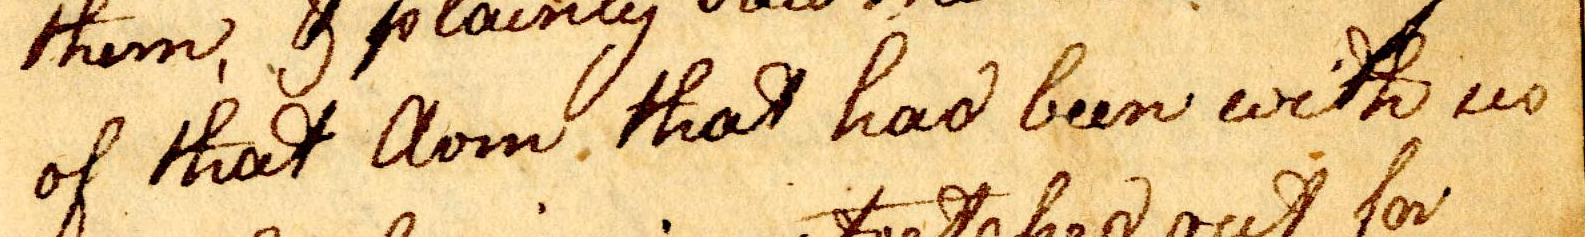of that Arm that had been with us
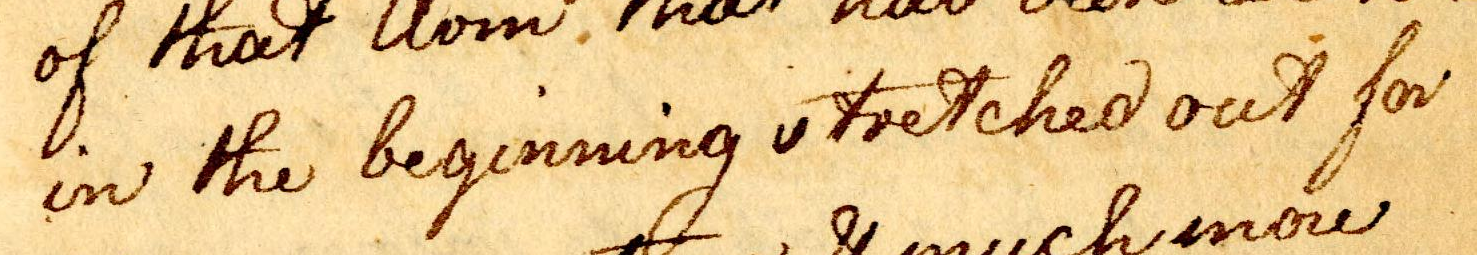in the beginning stretched out for
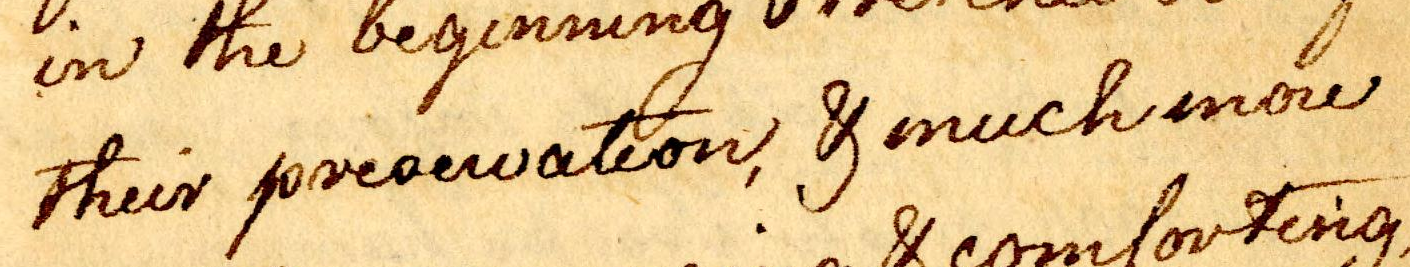their preservation, & much more
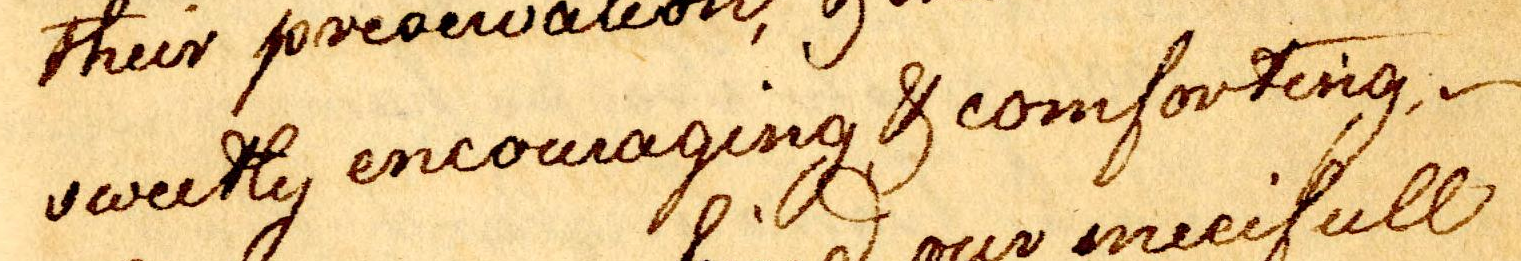sweetly encouraging & comforting.-
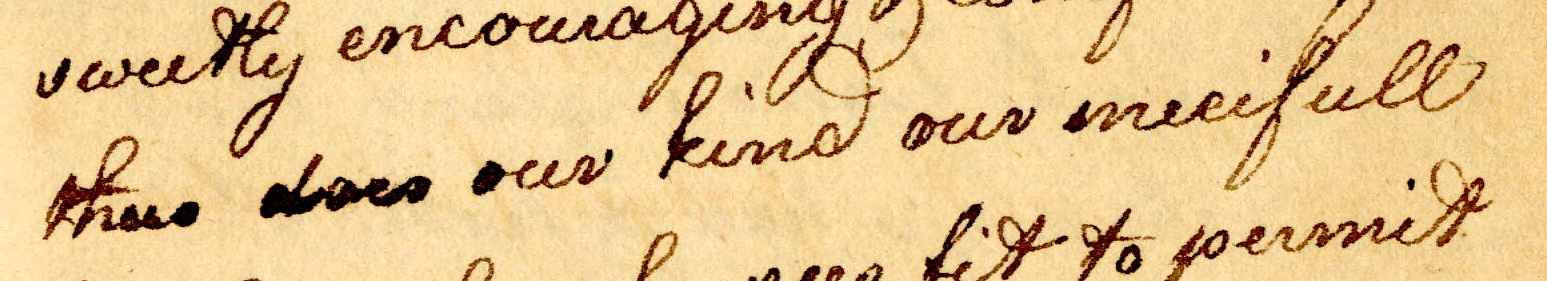thus does our kind our mecifull
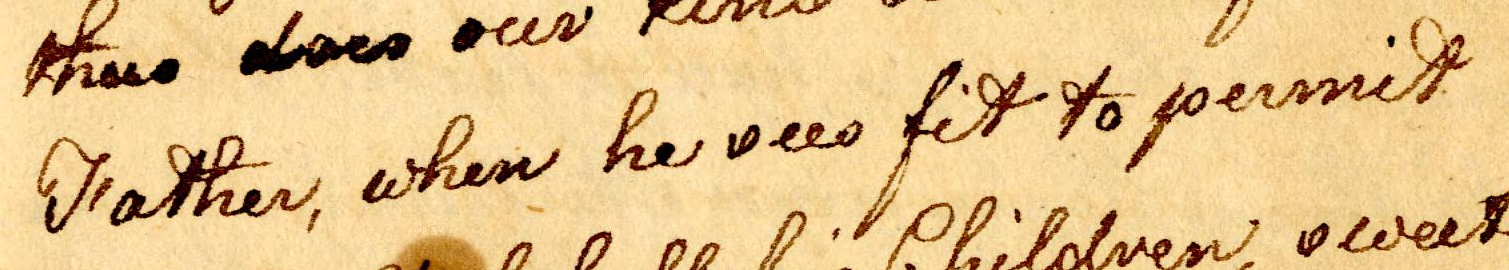Father, when he sees fit to permit
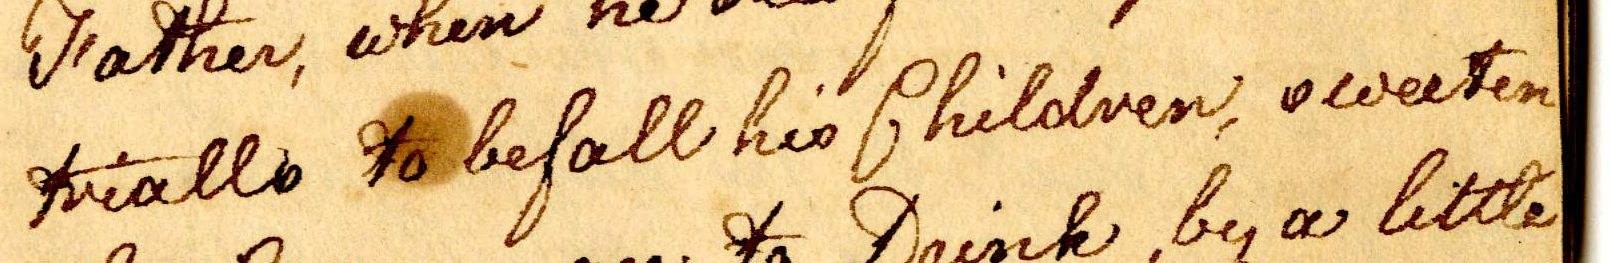trialls to befall his Children, sweeten
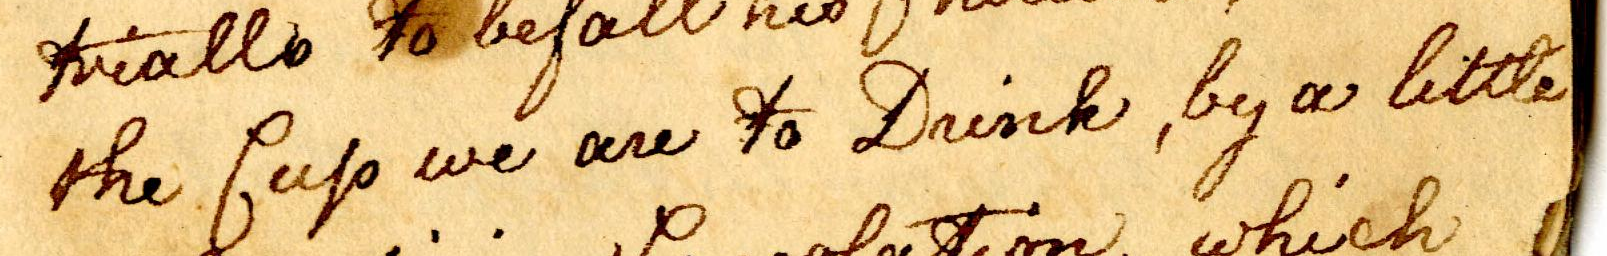the Cup we are to Drink, by a little
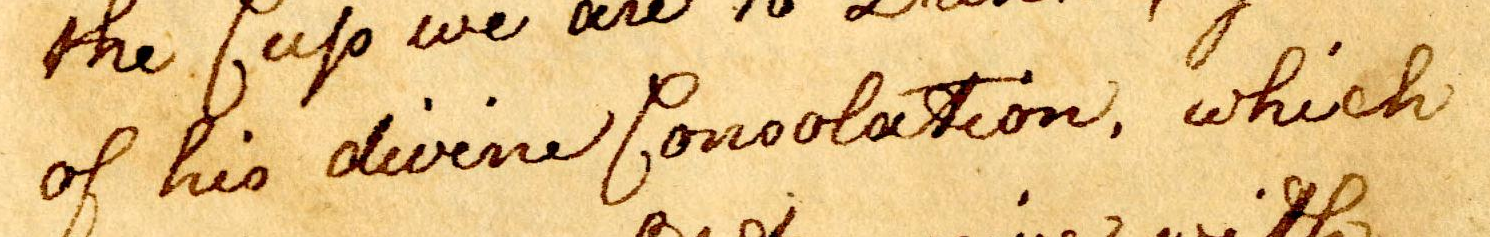of his divine Consolation, which
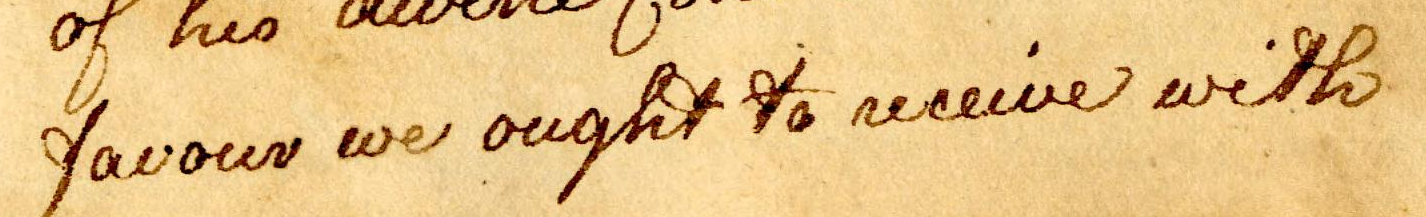favour we ought to receive with
